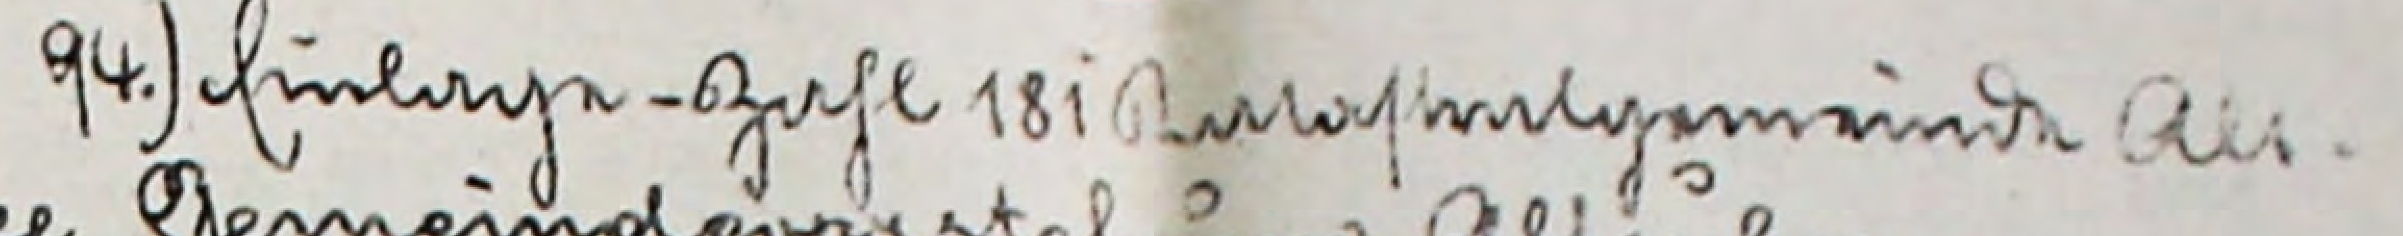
94.) Einlage - Zahl 181 Katastralgemeinde Alt=
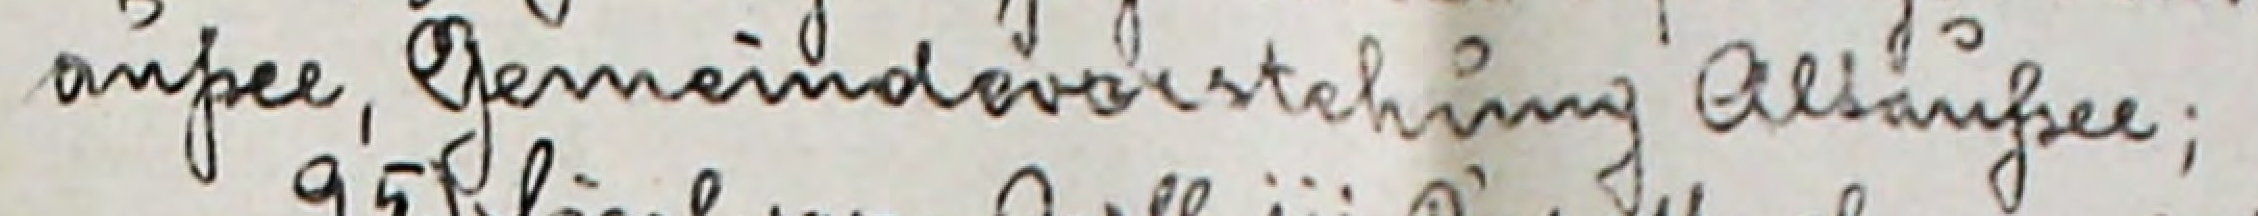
aussee, Gemeinde???stehung Altaussee;
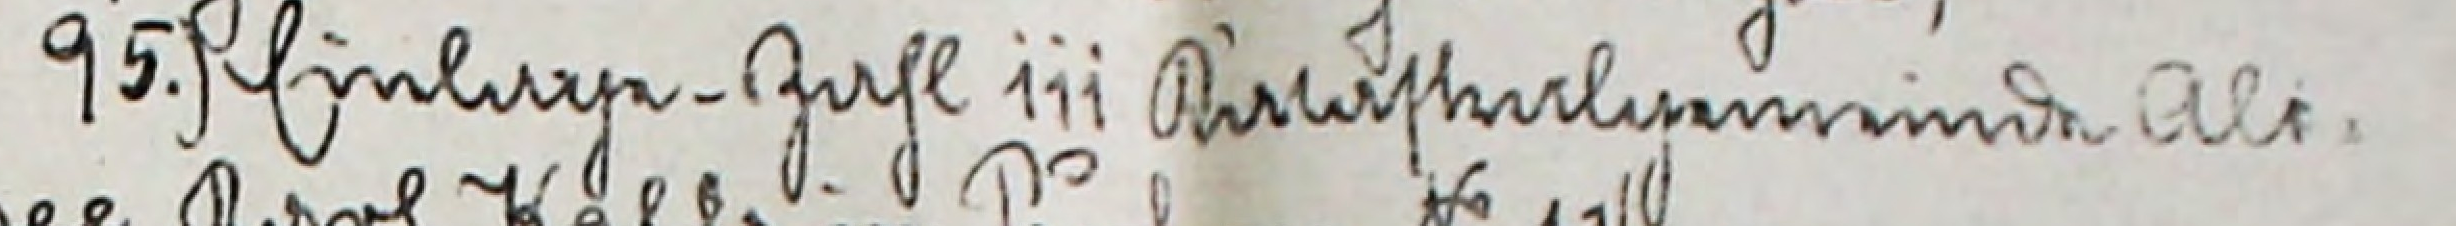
95.) Einlage - Zahl 111 Katastralgemeinde Alt=
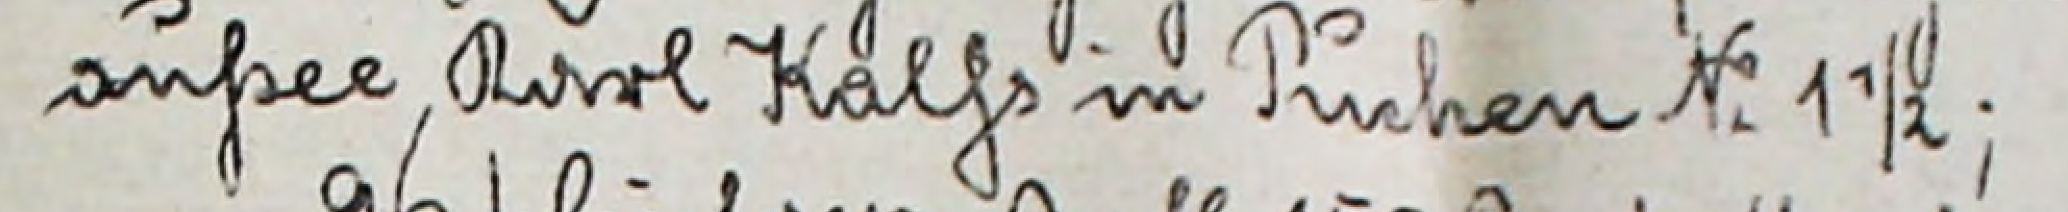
aussee, Karl Kalhs in Puchen № 1 1/2;
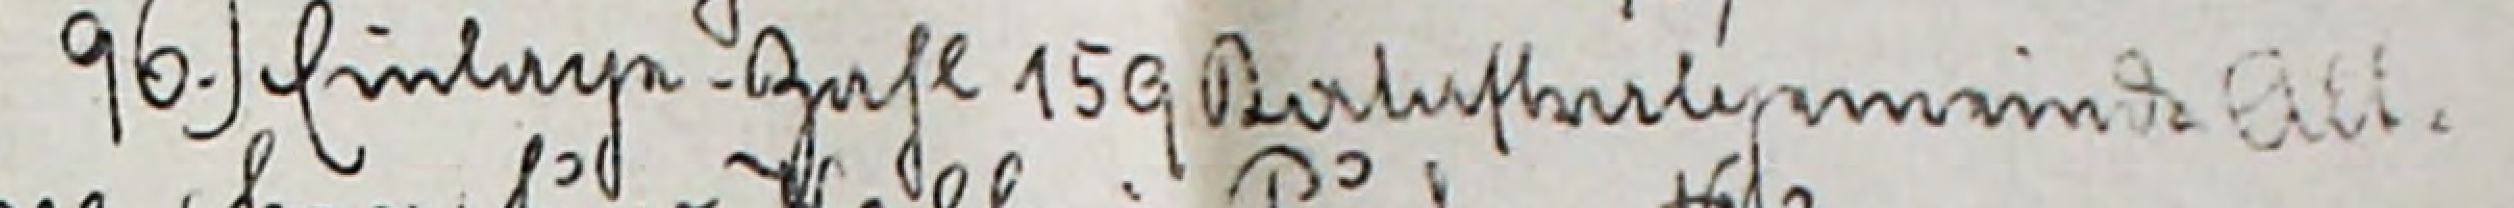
96.) Einlage - Zahl 159 Katastralgemeinde Alt=
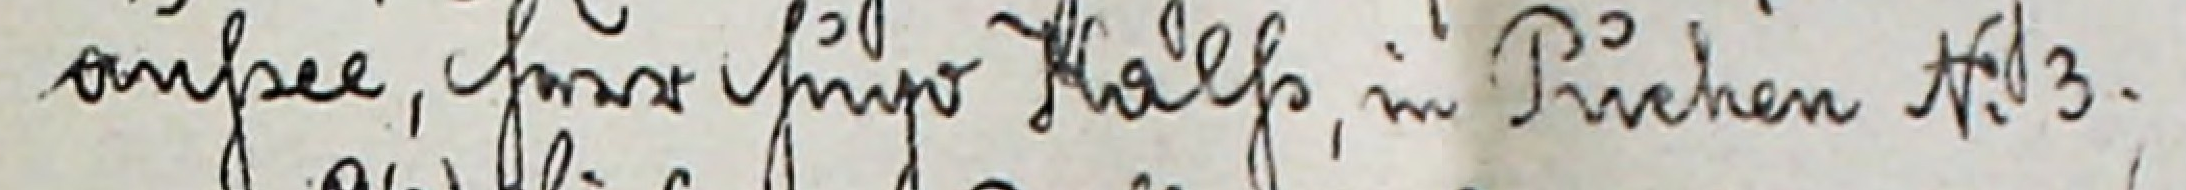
aussee, Herr Hugo Kalhs, in Puchen № 3;
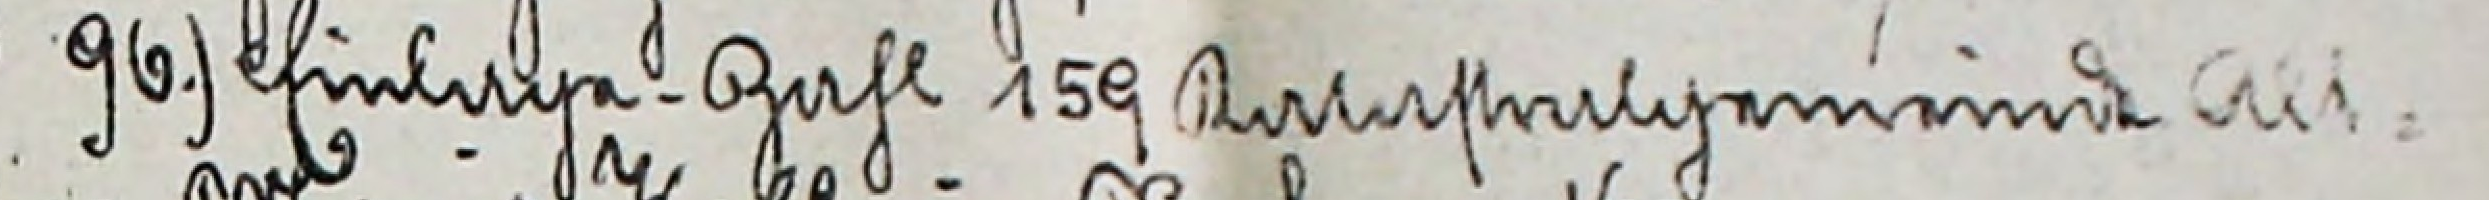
96.) Einlage - Zahl 159 Katastralgemeinde Alt=
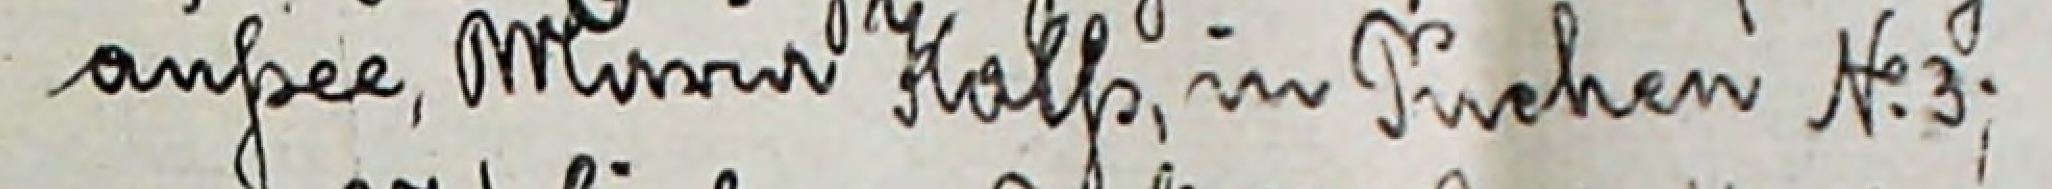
aussee, Maria Kalhs, in Puchen № 3;
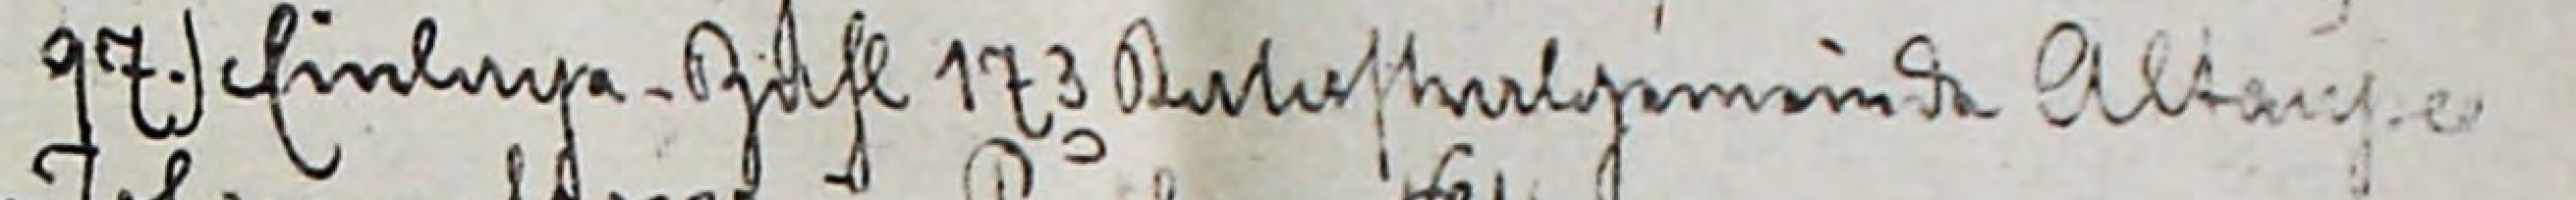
97.) Einlage - Zahl 173 Katastralgemeinde Altaussee
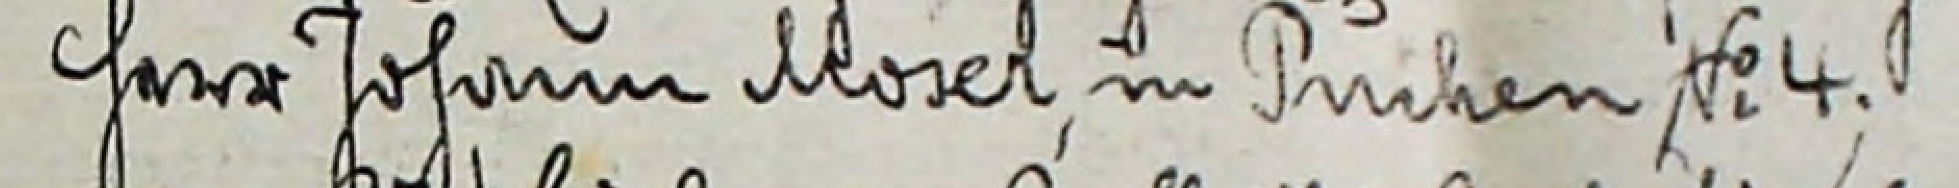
Herr Johann Moser, in Puchen № 4;
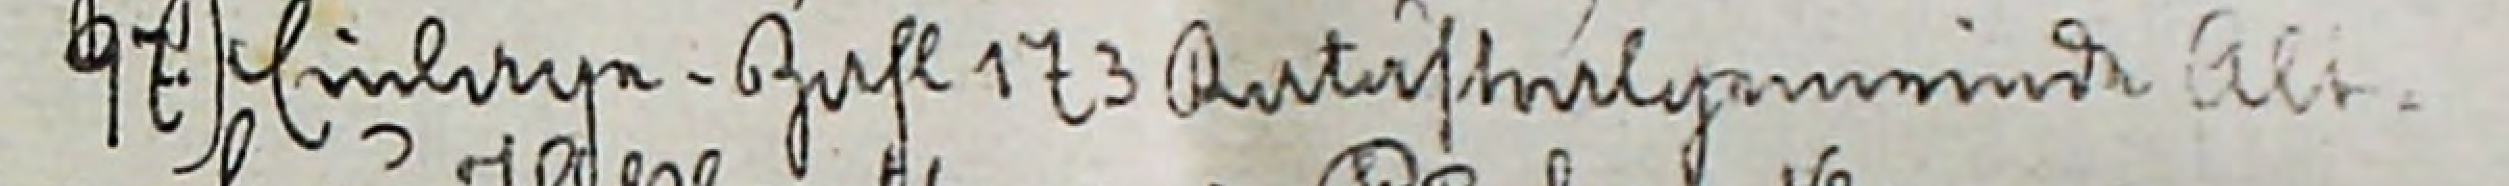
97.) Einlage - Zahl 173 Katastralgemeinde Alt=
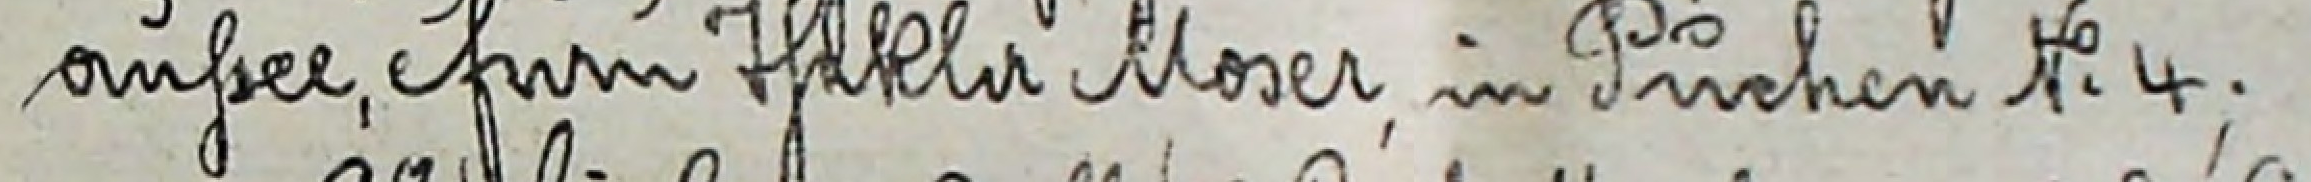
aussee, Frau Thekla Moser, in Puchen № 4;
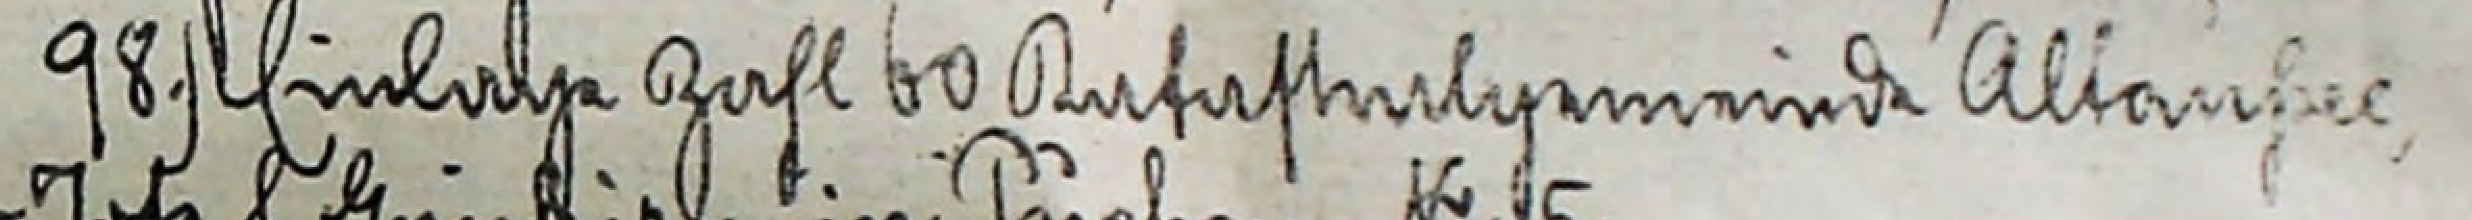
98.) Einlage - Zahl 60 Katastralgemeinde Altaussee,
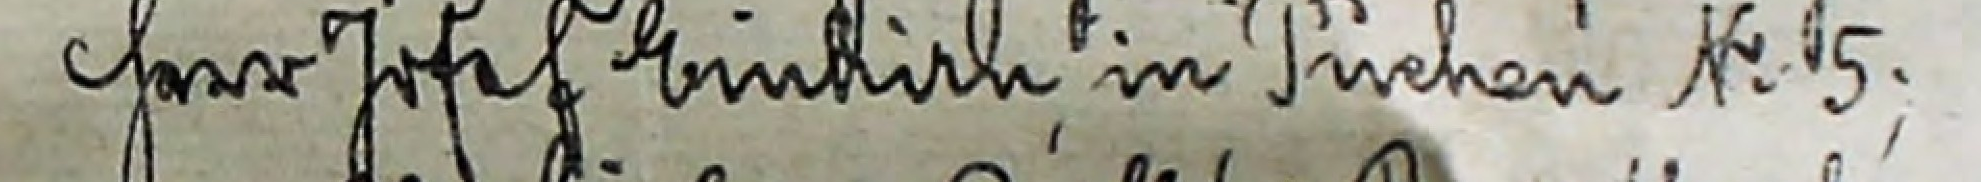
Herr Josef Einhirn, in Puchen № 5;
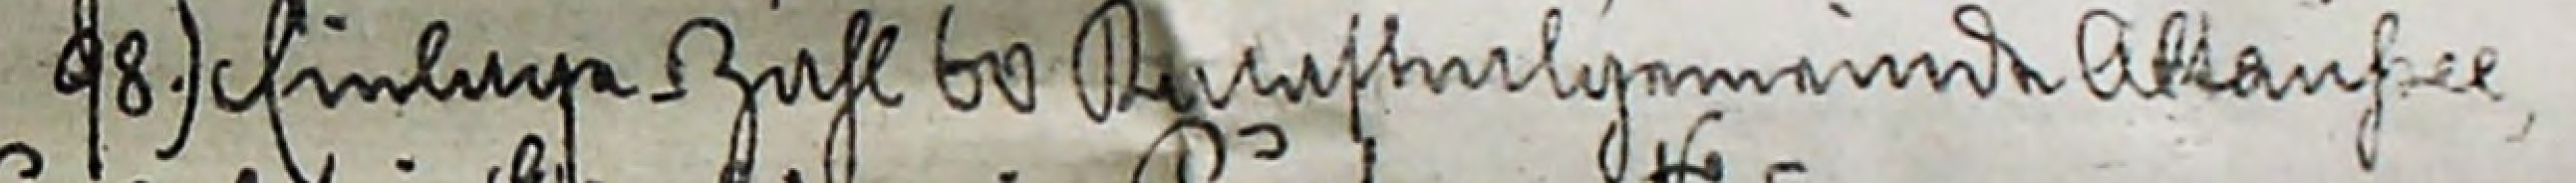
98.) Einlage - Zahl 60 Katastralgemeinde Altaussee,
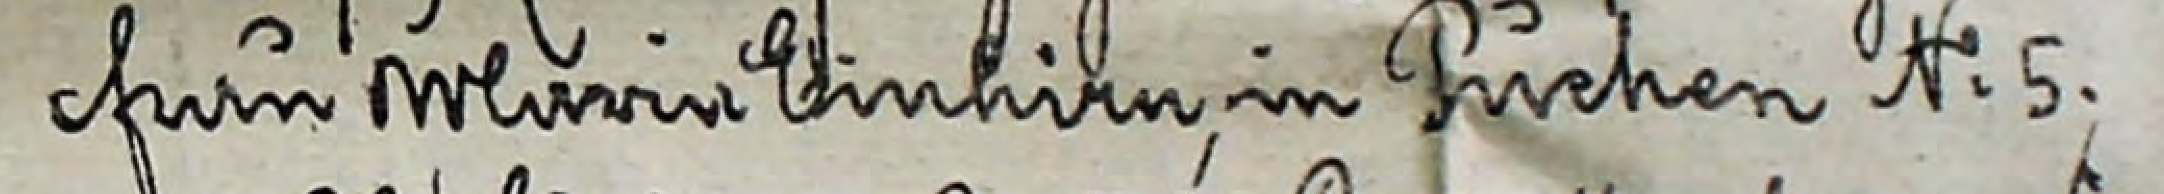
Herr Josef Einhirn, in Puchen № 5;
